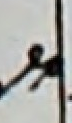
do
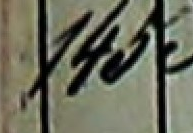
145
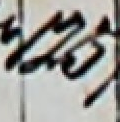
125
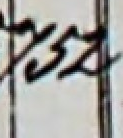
752
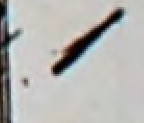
1
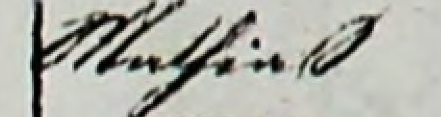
Mathias
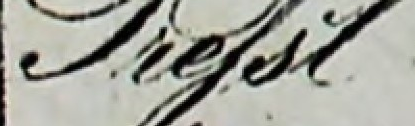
Pressl
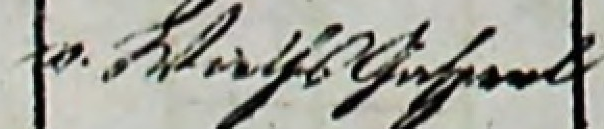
v. Waths Gasperl
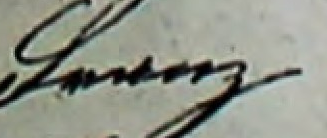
Franz
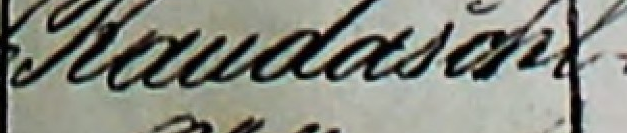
Raudaschl
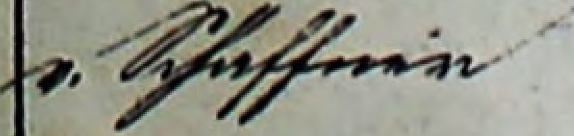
v. Schaffner
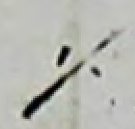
./.
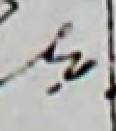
do
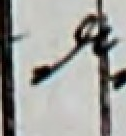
do
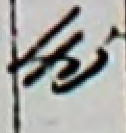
45
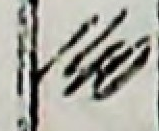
140
